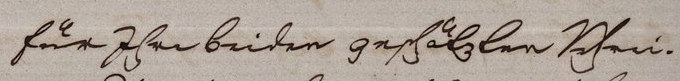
Für Ihre beiden geschätzten Schrei-
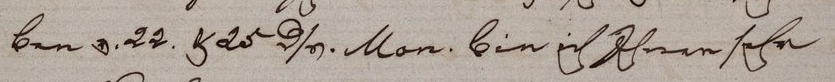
ben v. 22. & 25 dss. Mon. bin ich Ihnen sehr
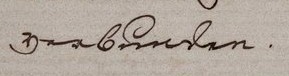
verbunden.
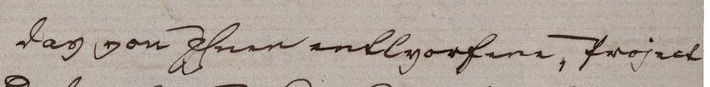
Das von Ihnen entworfene «Project
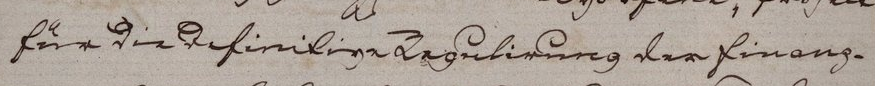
für die definitive Regulierung der Finanz-
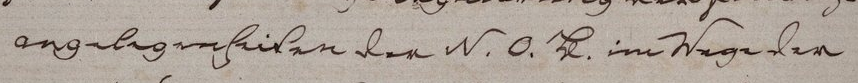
angelegenheiten der N.O.B. im Wege der
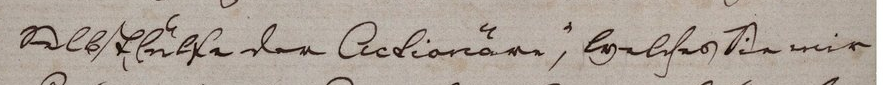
Selbsthülfe der Actionäre», welches Sie mir
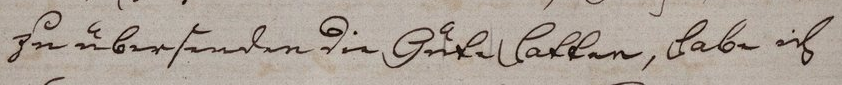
zu übersenden die Güte hatten, habe ich
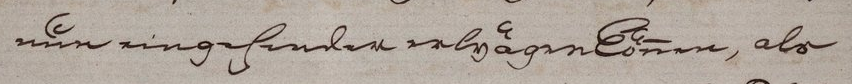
nun eingehender erwägen können, als
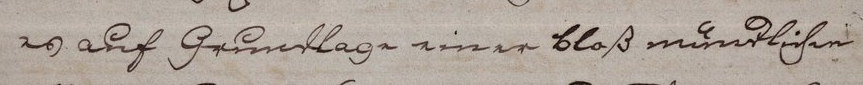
es auf Grundlage einer bloß mündlichen
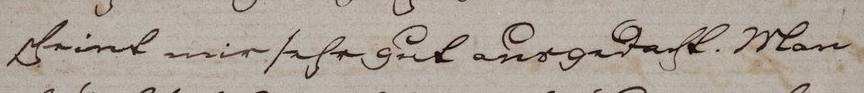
scheint mir sehr gut ausgedacht. Man
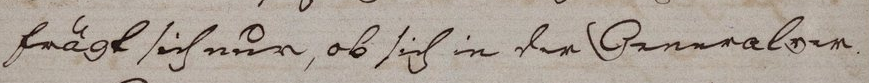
frägt sich nur, ob sich in der Generalver-
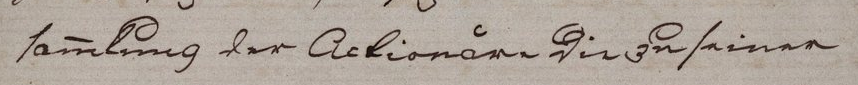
sammlung der Actionäre die zu seiner
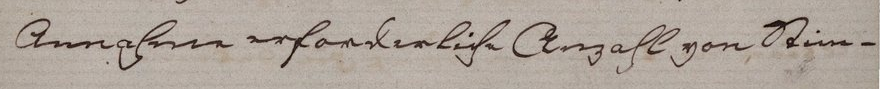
Annahme erforderliche Anzahl von Stim-
